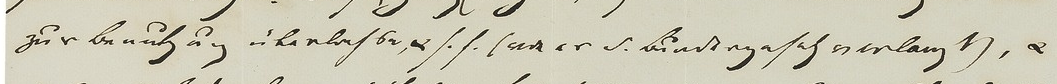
zur Benutzung überlasse, &s. f. (wie es d. Bundesgesetz verlangt), &
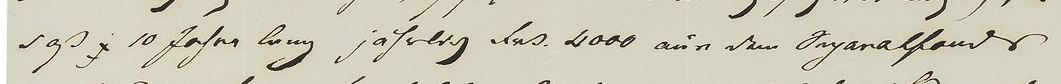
daß 10 Jahre lang jährlich Frk. 4000 aus dem Separatfonds
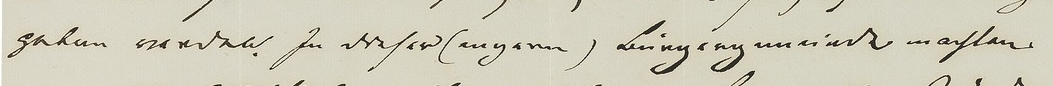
geben werden. In dieser (engern) Bürgergemeinde machten
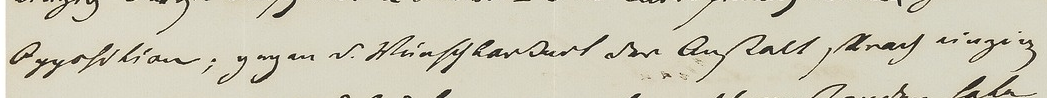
Opposition; gegen die Wünschbarkeit der Anstalt sprach einzig
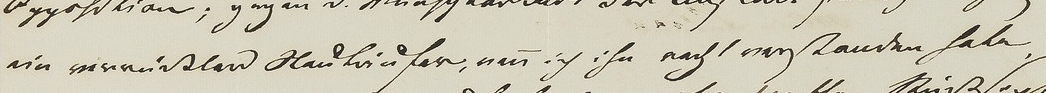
ein verrückter Neutäufer; wenn ich ihn recht verstanden habe,
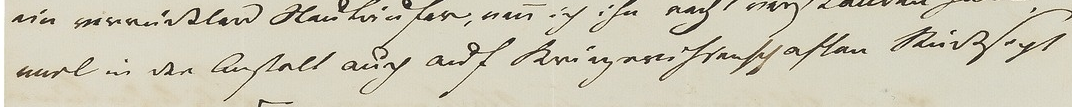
weil in der Anstalt auch auf Kriegswissenschaften Rücksicht
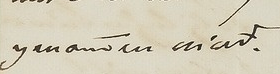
genommen wird.
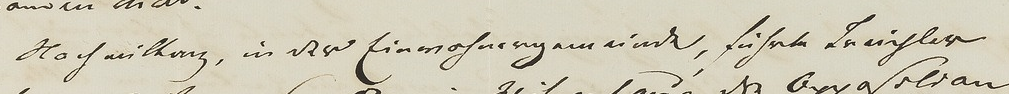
Nachmittag, in der Einwohnergemeinde, führte Treichler
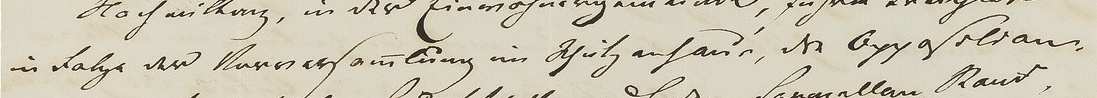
in Folge der Vorversammlung im Schützenhaus, die Opposition.
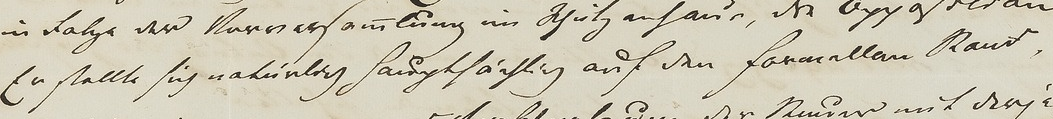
Er stellte sich natürlich hauptsächlich auf den formellen Stand-
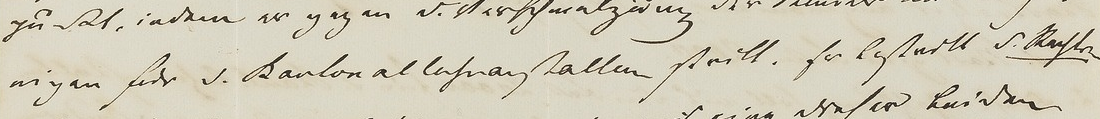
nigen für d. Kantonallehranstalten stritt. Er bestritt d. Rechts-
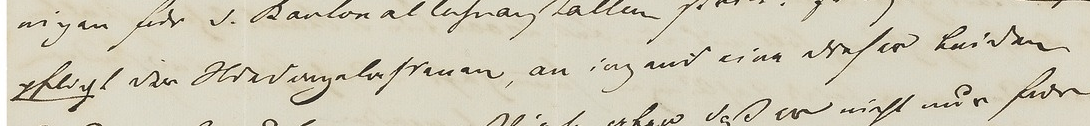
pflicht der Niedergelassenen, an irgend eine dieser beiden
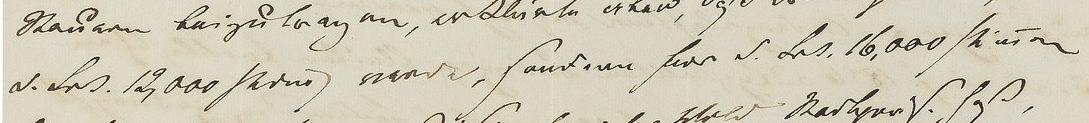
d. Frk. 12,000 sein werde, sondern für d. Frk. 16,000 stimmen
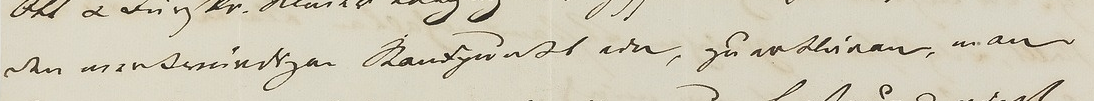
den merkwürdigen Standpunkt ein, zu erklären, man
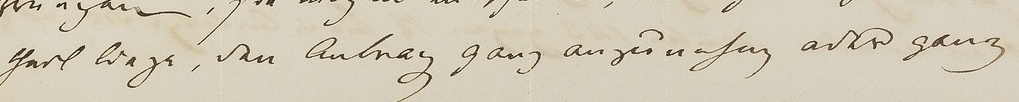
theil liege, den Antrag ganz anzunehmen oder ganz
